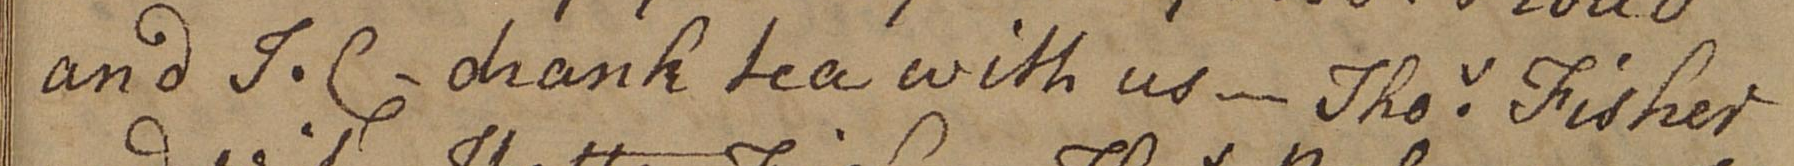and T.C- drank tea with us- Tho^s. Fisher
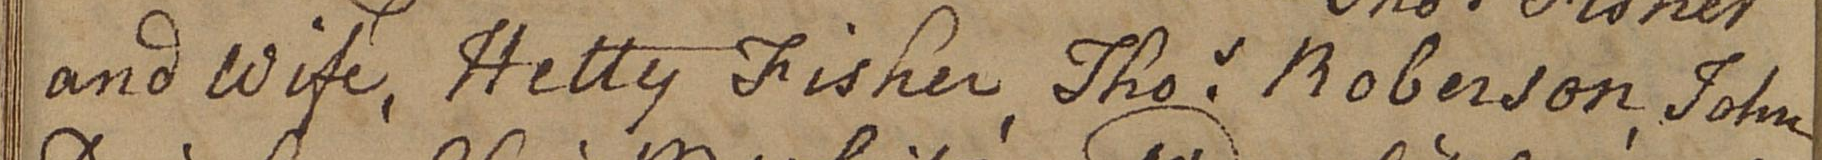and Wife, Hetty Fisher, Tho^s. Roberson, John
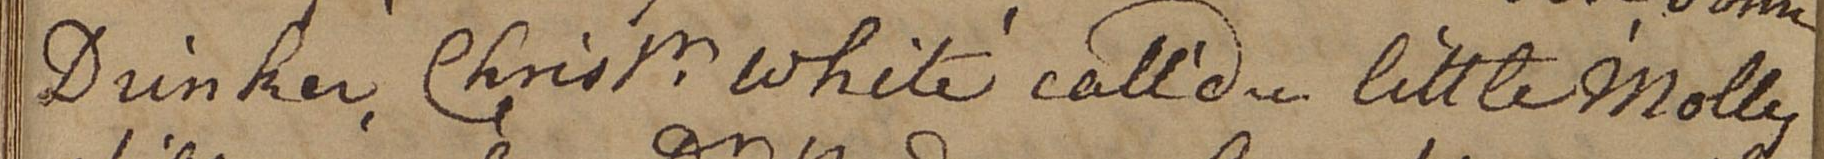Drinker, Christ^r. White call'd- little Molly
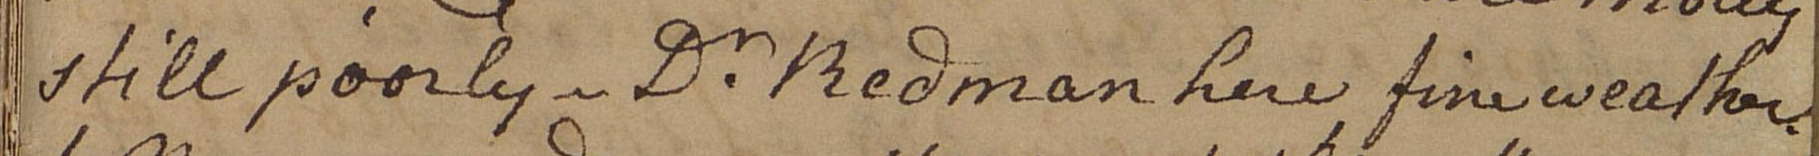still poorly- D^r. Redman here fine weather
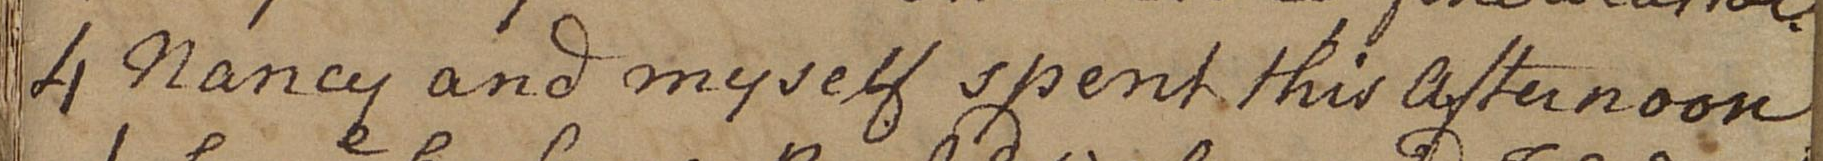4 Nancy and myself spent this Afternoon
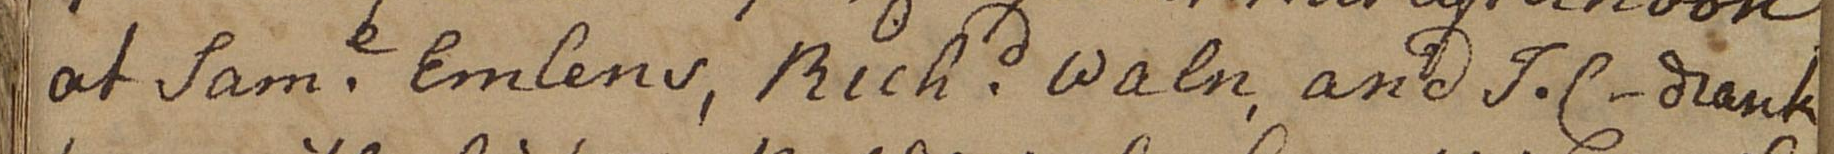at Sam^l Emlens, Rich^d. Waln, and T.C- drank
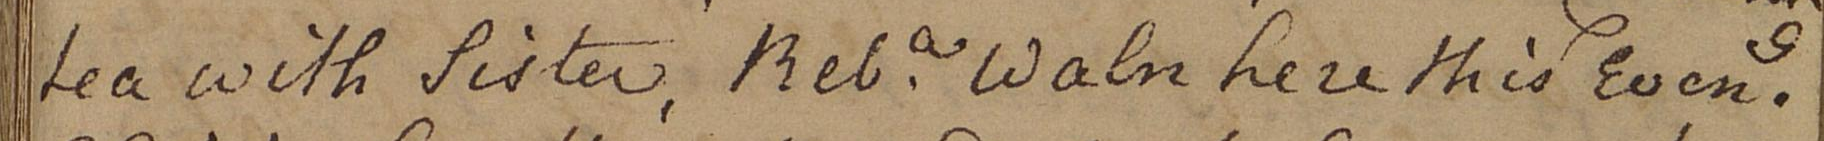tea with Sister, Reb^a. Waln here this Even^g.
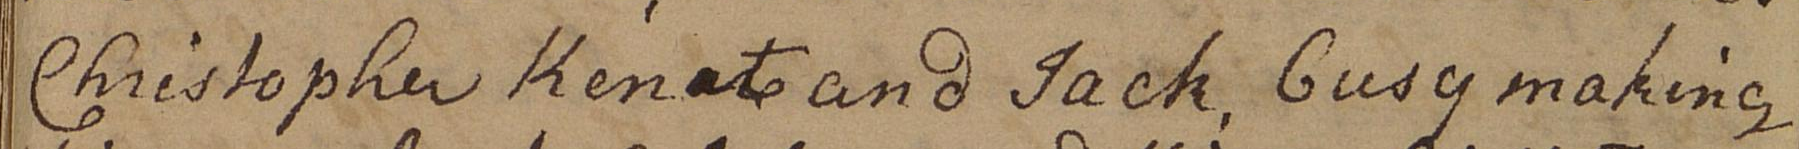Christopher Kenat and Jack, busy making
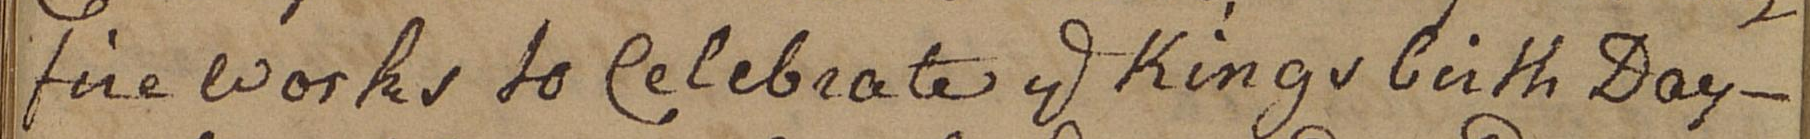fire works to Celebrate y^e Kings birth Day-
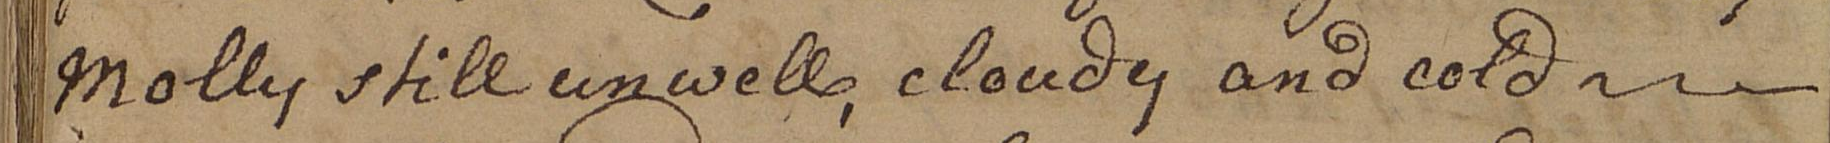Molly still unwell, cloudy and cold-
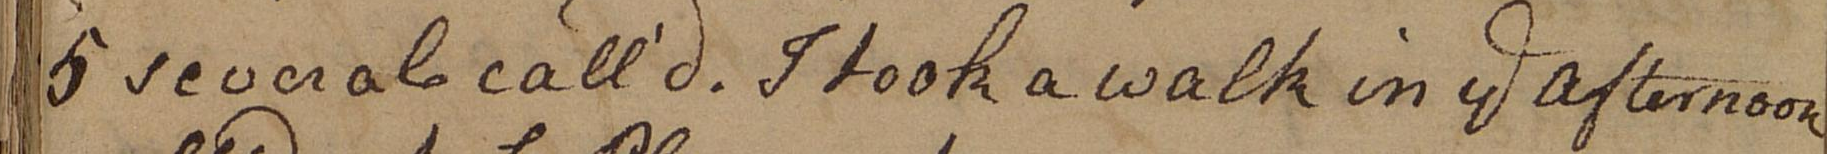5 several call'd. I took a walk in y^e Afternoon
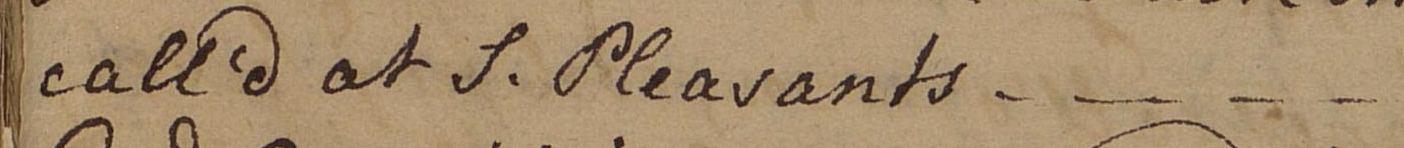call'd at S. Pleasants---
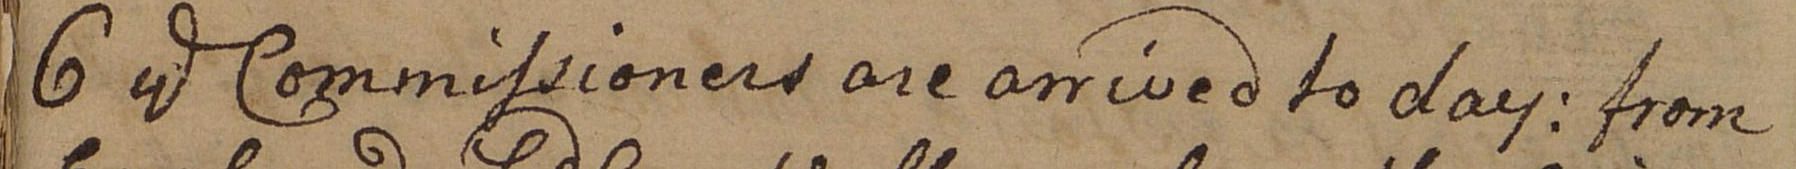6 y^e Commissioners are arrived to day: from
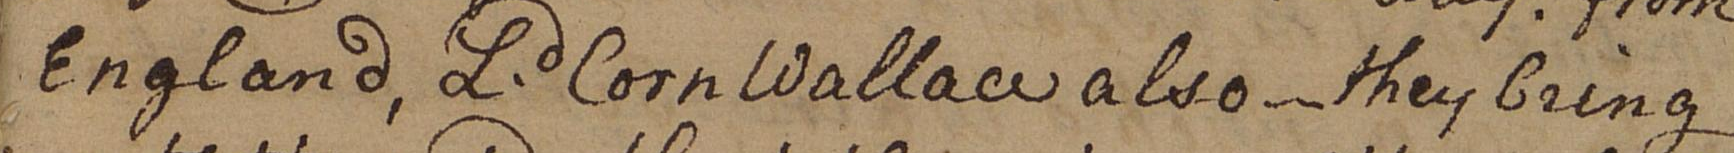England, L^d. Corn Wallace also- they bring
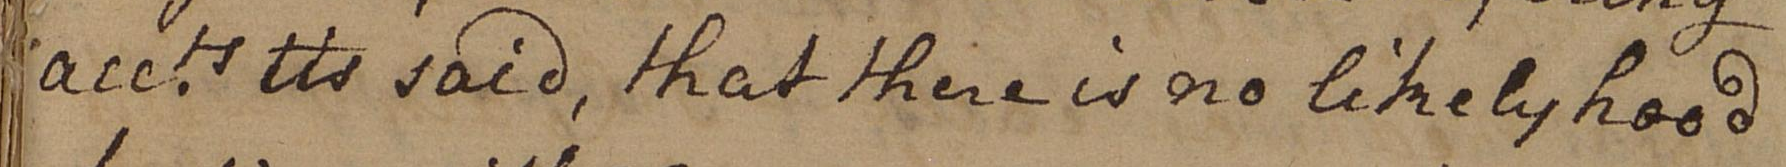acc^ts. tis said, that there is no likelyhood
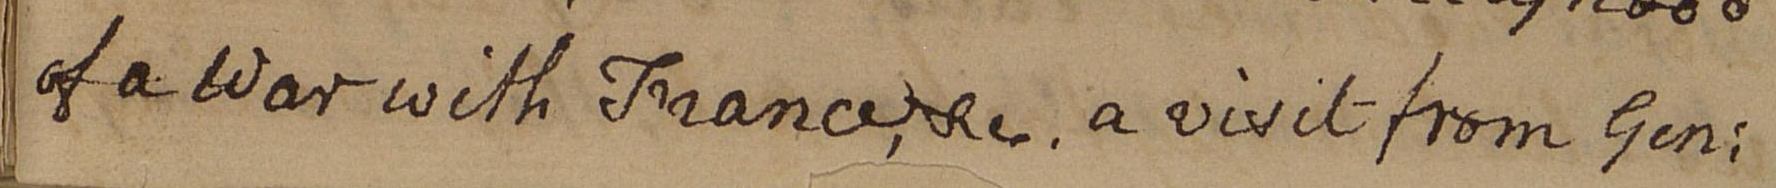of a War with France, &c. a visit from Gen:
